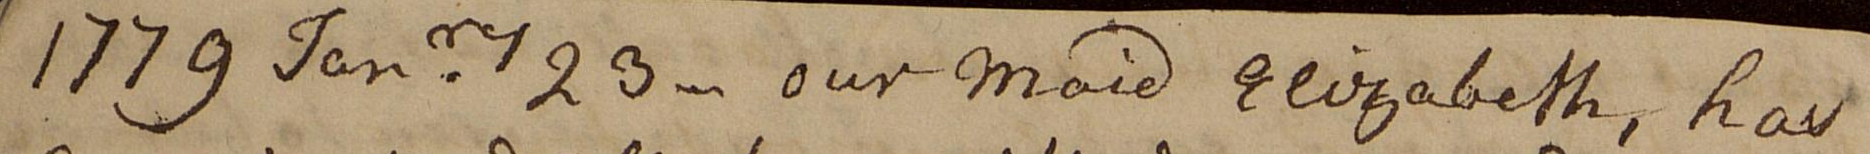1779 Jan^ry. 23- our maid Elizabeth, has
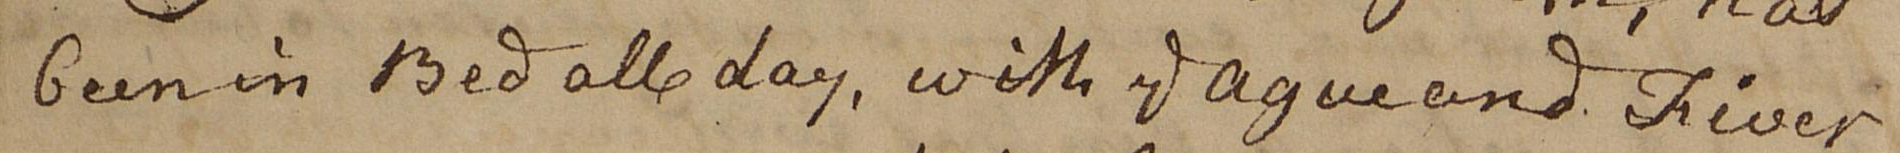been in Bed all day, with y^e ague and Fiver,
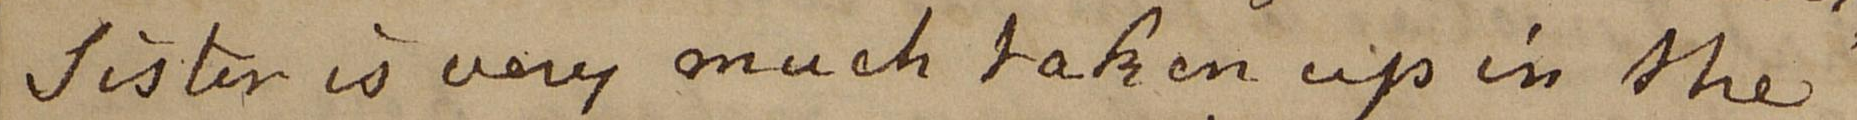Sister is very much taken up in the
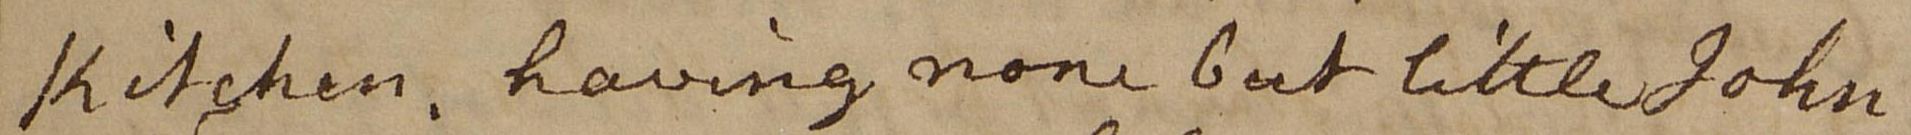Kitchen having none but little John
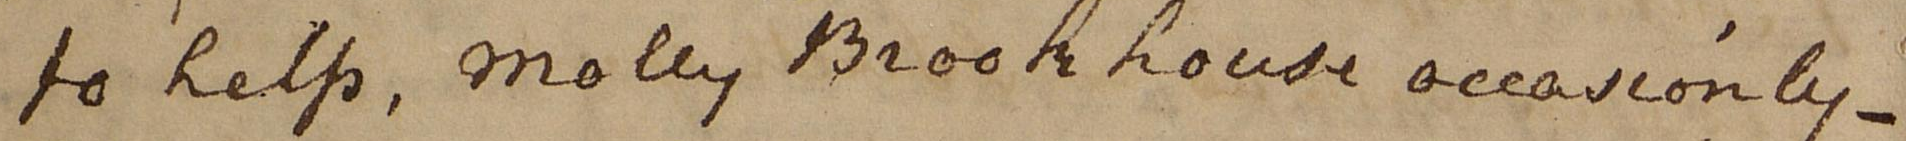to help, Molly Brook house occasionly
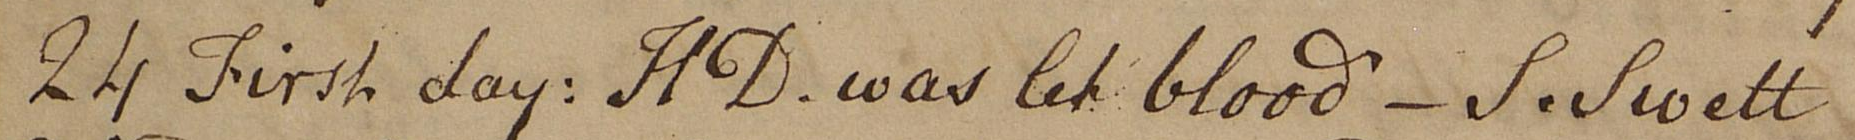24 First day: HD. was let blood- S. Swett
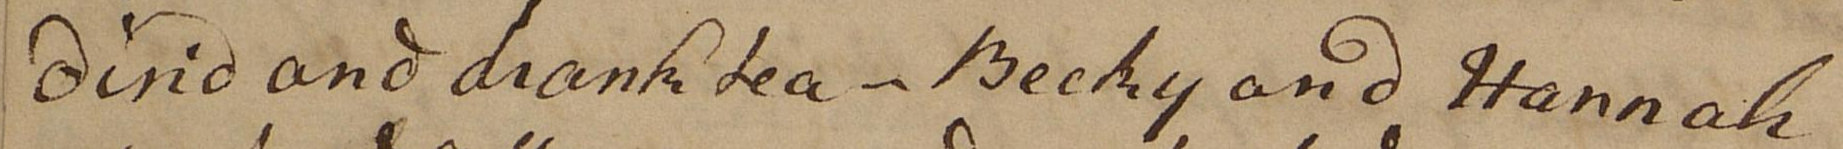din'd and drank tea- Becky and Hannah
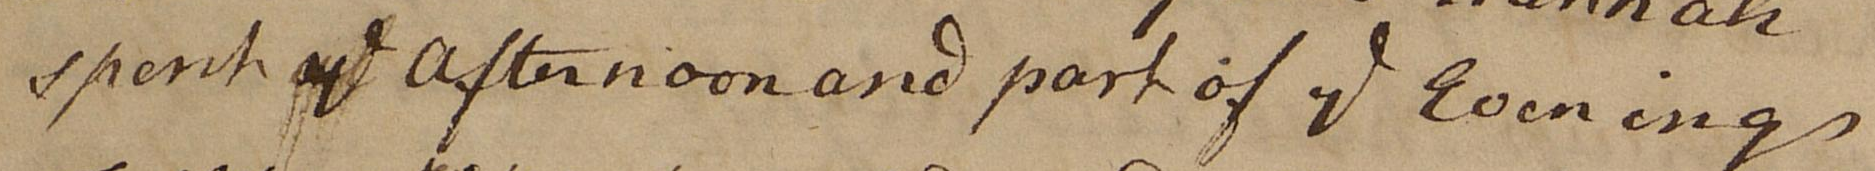spent y^e Afternoon and part of y^e Evening
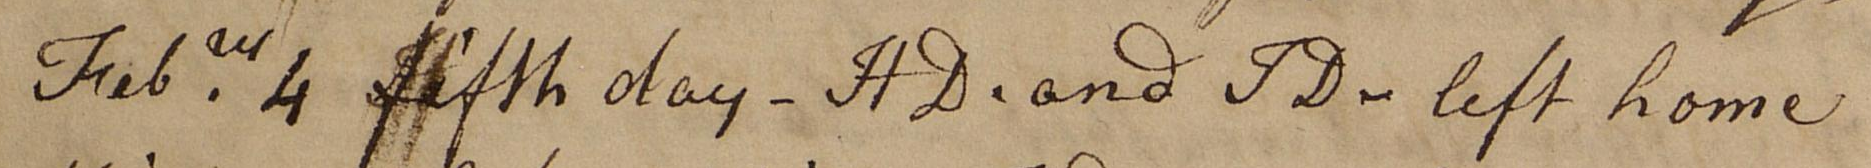Feb^ry. 4 fifth day- HD. and ID- left home
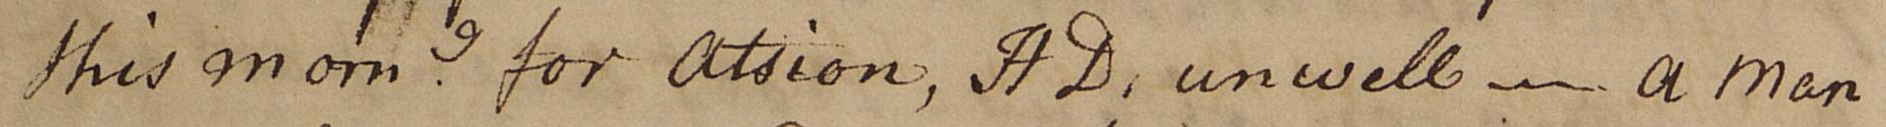this morn^g. for Atsion, HD, unwell- A Man
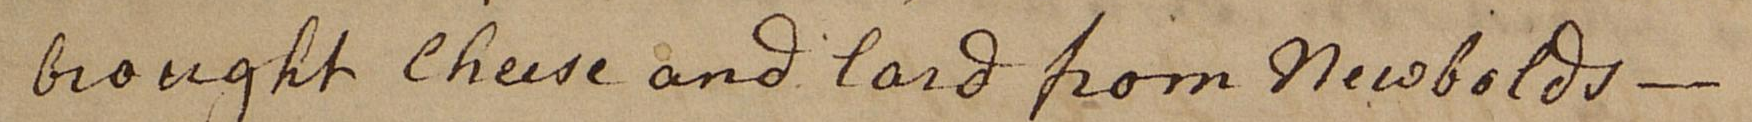brought Cheese and lard from Newbolds-
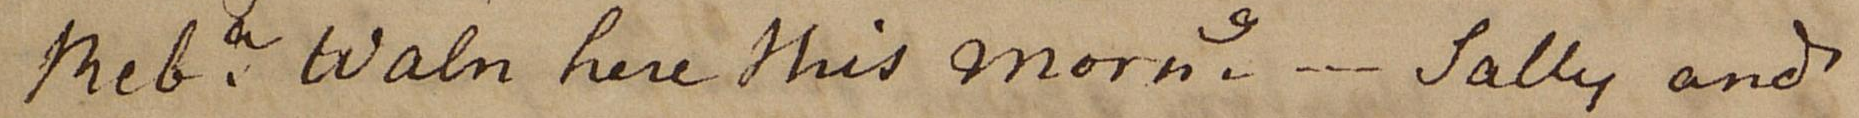Reb^a Waln here this morn^g.-- Sally and
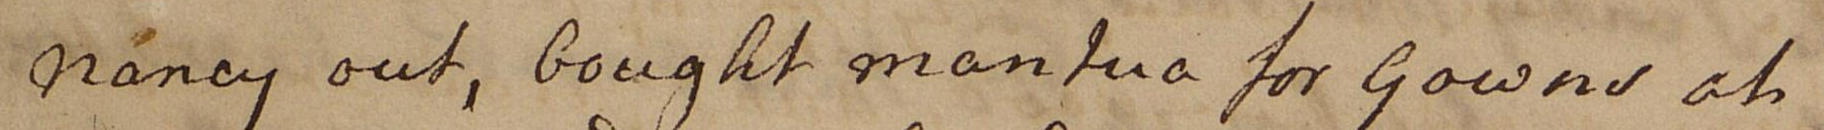Nancy out, bought mantua for Gowns at
